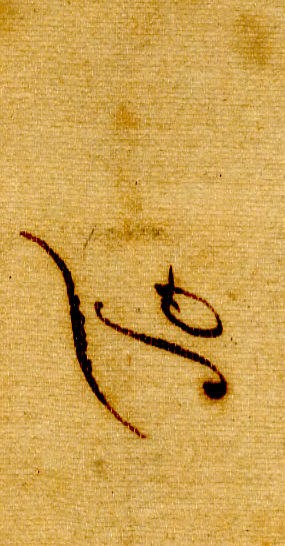To
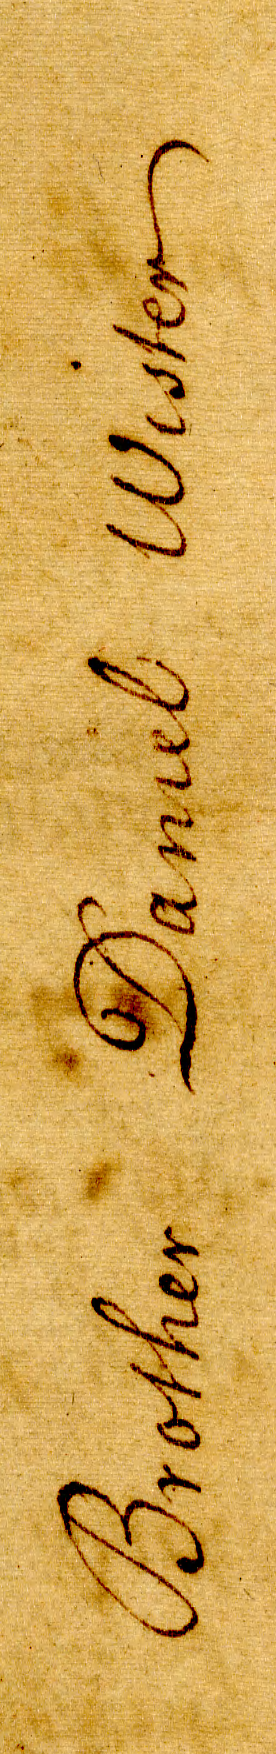Brother Daniel Wister
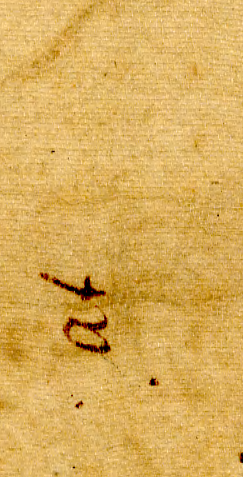at
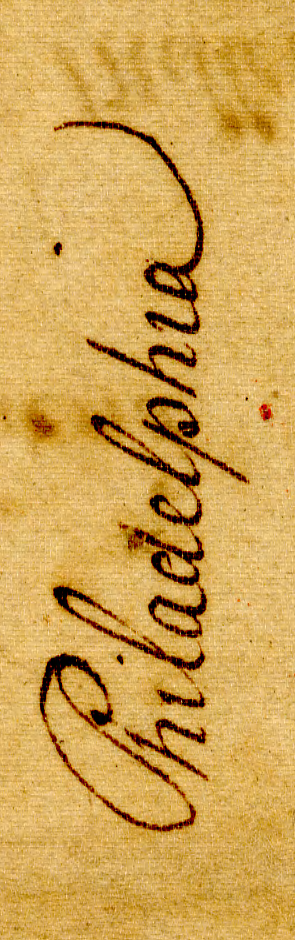Philadelphia
